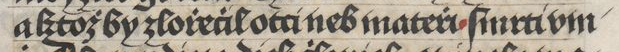a ktoż by zloṙeċil otci neb mateṙi ſmrti vm¬
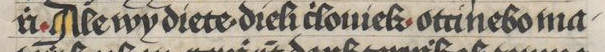ṙi.Ale wydiete.díeli ċlouiek.otci nebo ma¬
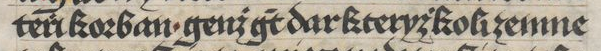teṙi korban.genż ḡt dar kteryżkoli zemne
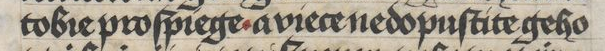tobie proſpiege.a viece nedopuſtíte geho
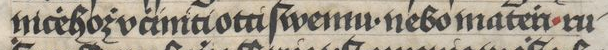niċehož vċiniti otci ſwemu.nebo mateṙi.ru¬
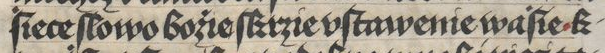ẛíece ſlowo božíe ſkrzie vſtawenie waẛie.k¬
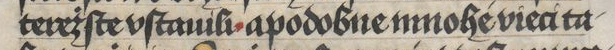teréžſte vſtauili.a podobne mnohé vieci ta¬
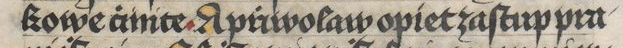kowe ċinite.A pṙiwolaw opiet zaſtup pra¬
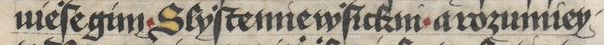uíeẛe gím.Slyẛte mie wẛickni.a rozumiey
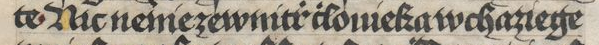te.Nic nenié zewnitṙ ċlowieka wchaziege
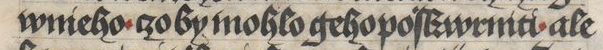wnieho.czo by mohlo geho poẛkwrniti.ale
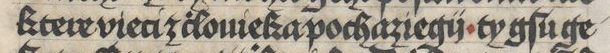ktere vieci z ċlouieka pochaziegij.ty gſu ge¬
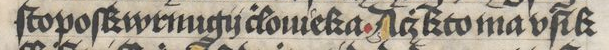ſto poſkwrnugij ċlouieka.Aċ kto ma vẛi k
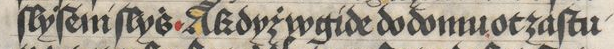ſlyẛení ſlyṡ.Akdyż wgide do domu ot zaſtu¬
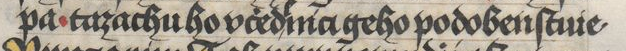pa.tazachu ho vċedlinci geho podobenſtuie.
